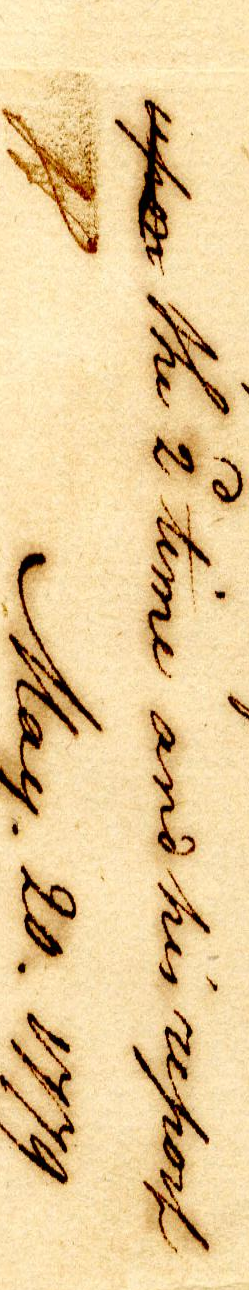[upon] the 2^d time and his report
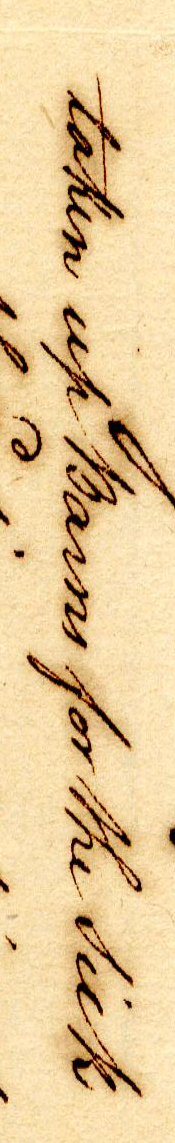taken up Barns for the sick
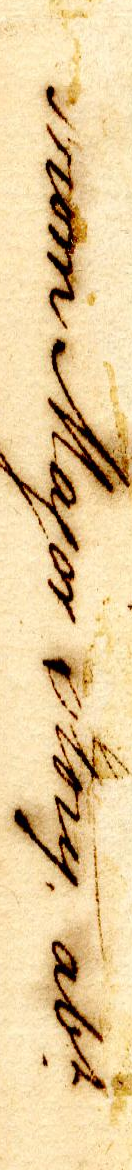From Major Story ab^t.
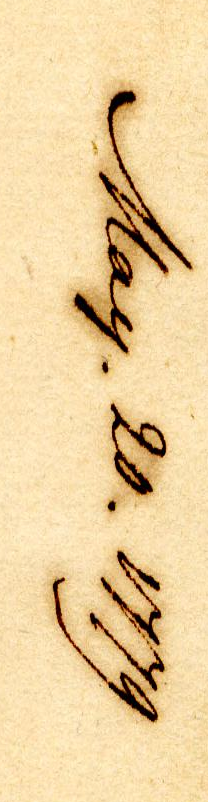May. 20. 1779
